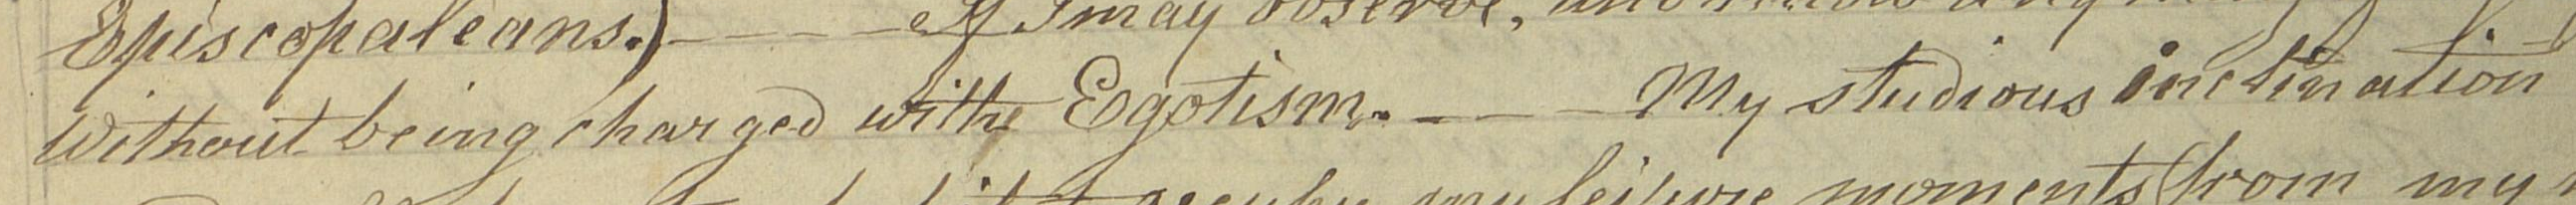Without being charged with Egotism. My studious inclination
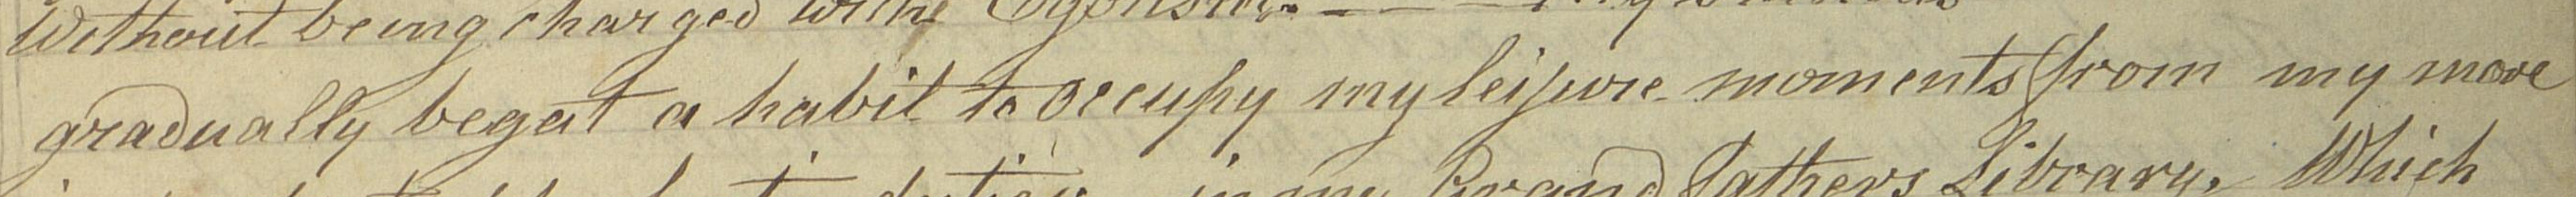gradually begat a habit to occupy my leisure moments from my more
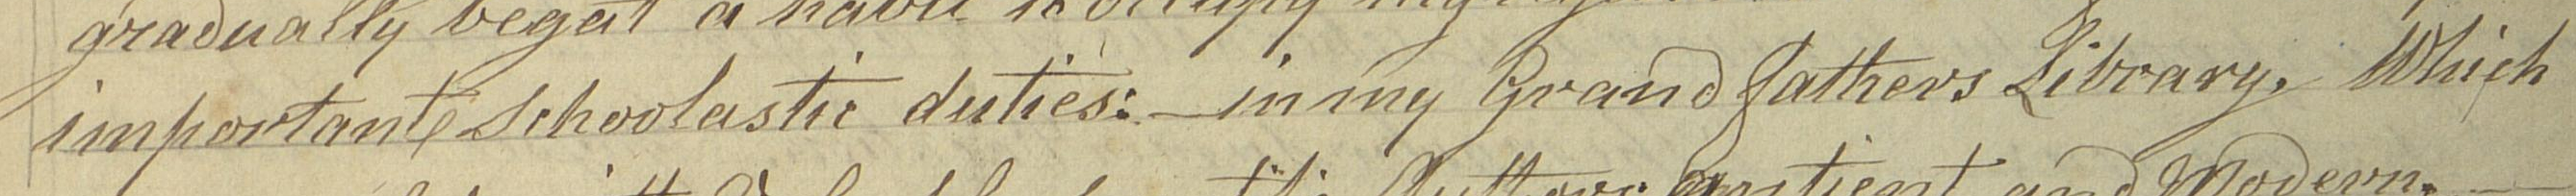important schoolastic duties: in my Grand fathers Library, Which
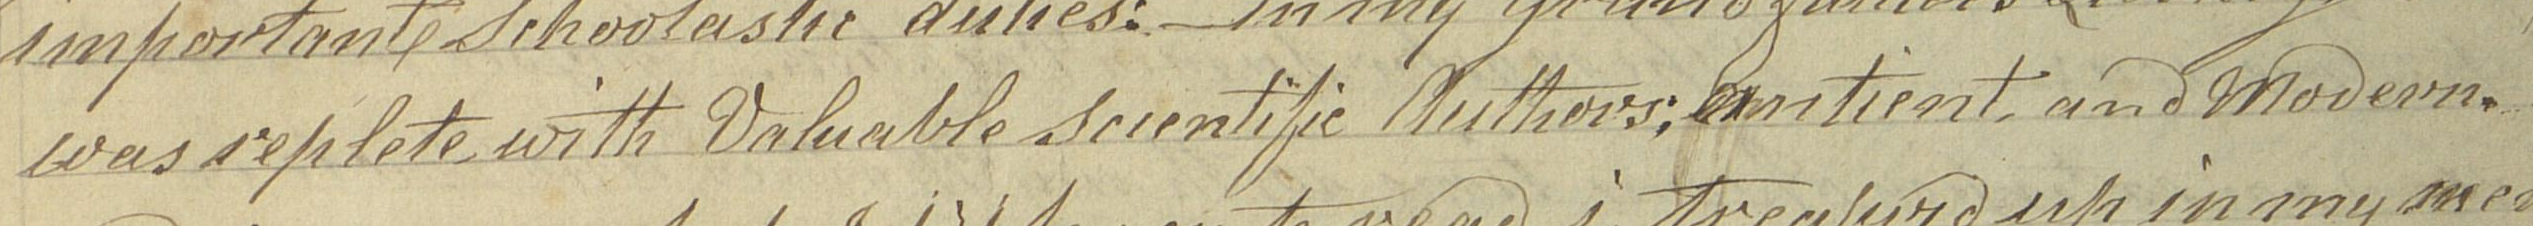was replete with Valuable Scientific Authors; antient and Modern.
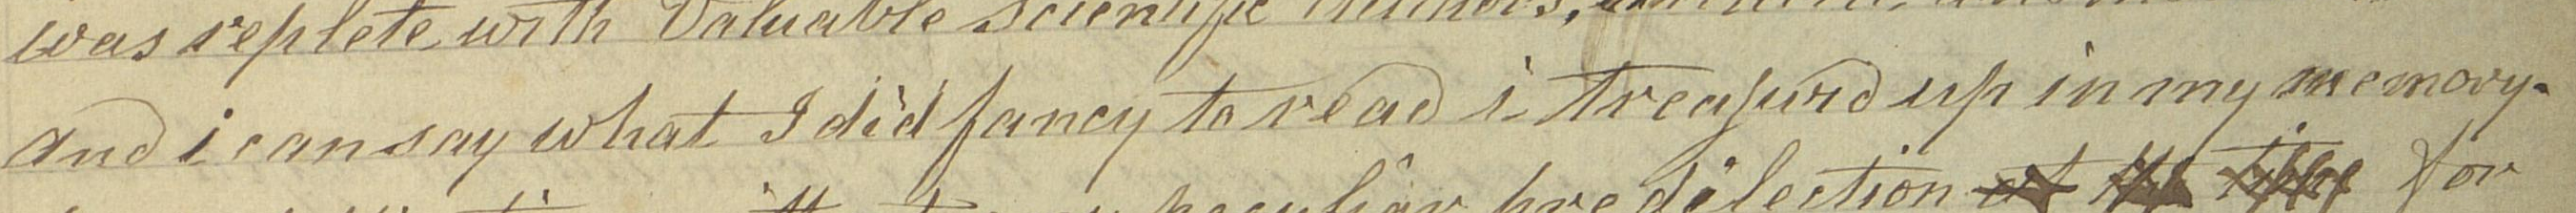and i can say what I did fancy to read i treasured up in my memory.
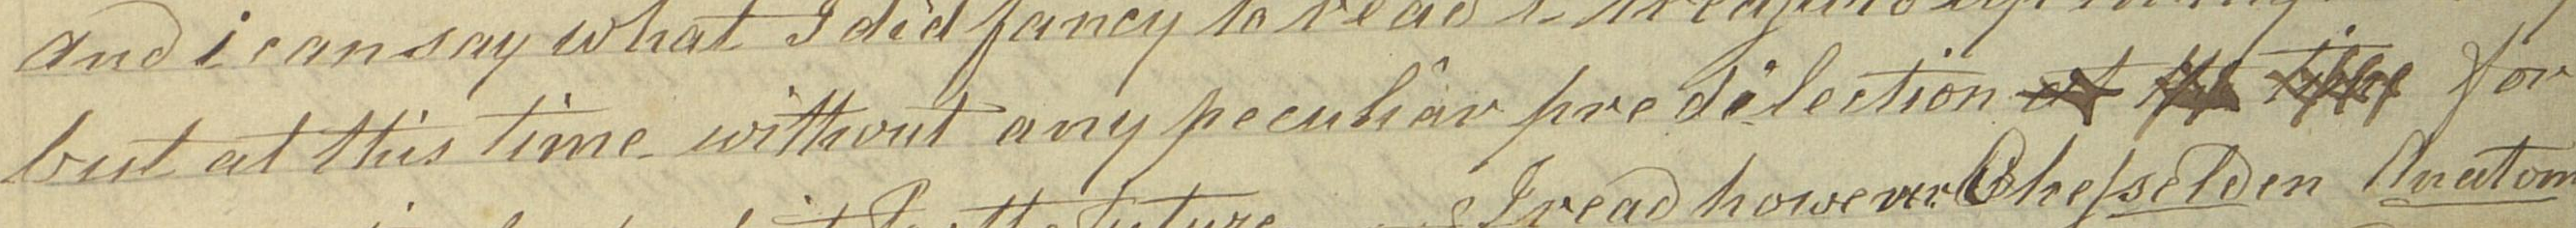but at this time without any peculiar predilection at the time for
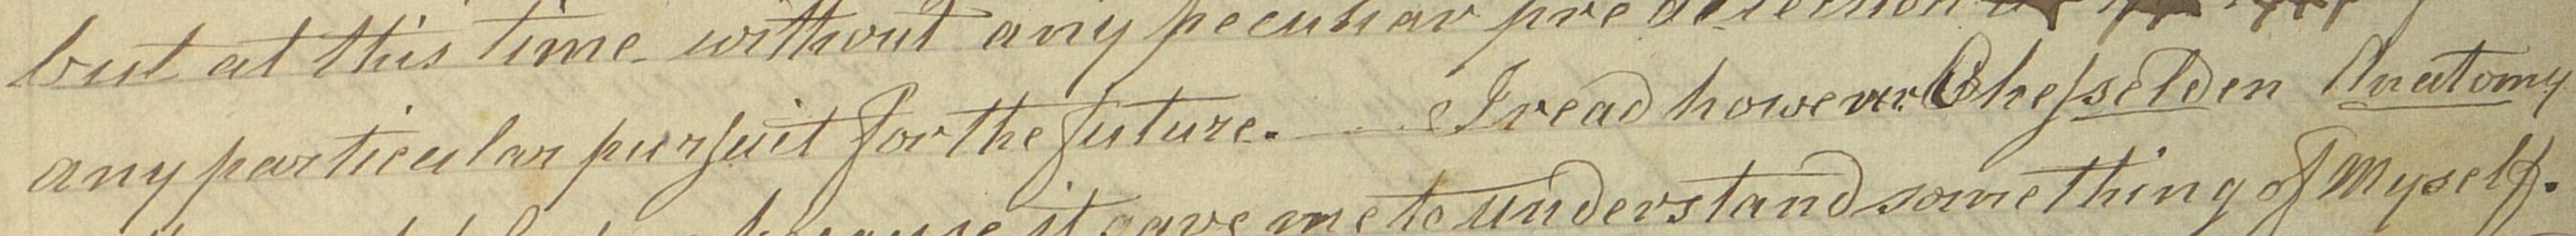any particular pursuit for the future. I read however Chesselden Anatomy
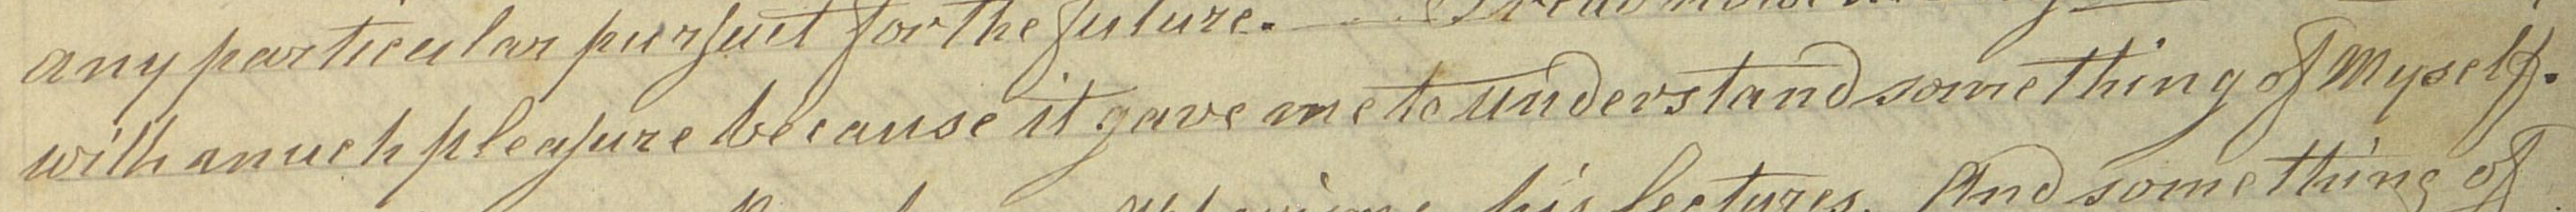with much pleasure because it gave me to understand something of Myself.
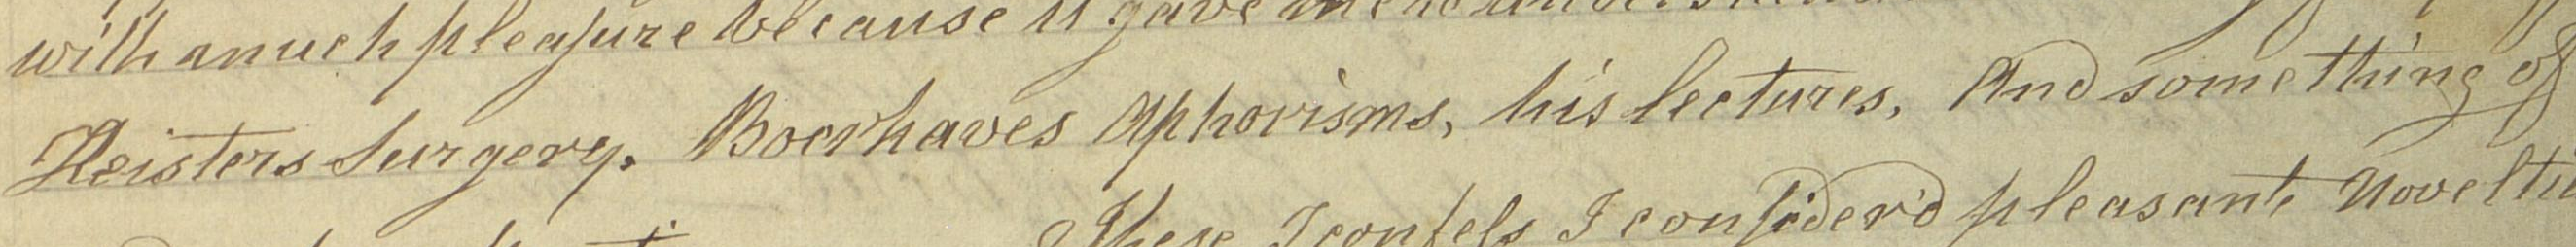Reisters Surgery, Boerhaves Aphorisms, his lectures, and something of
